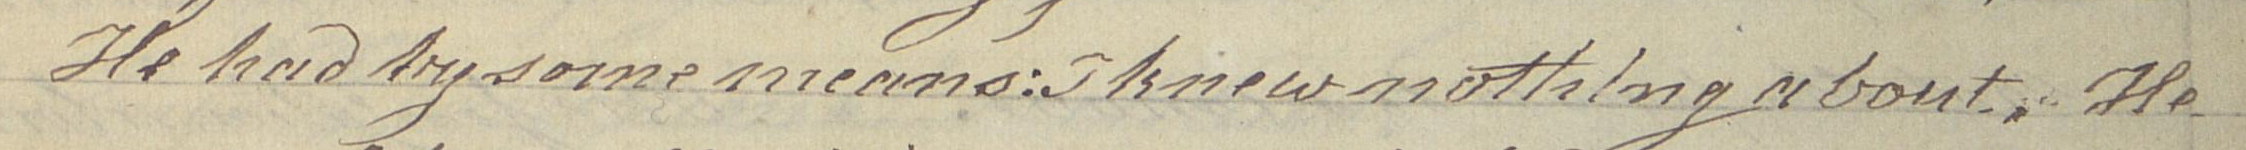He had by some means: I knew nothing about. He
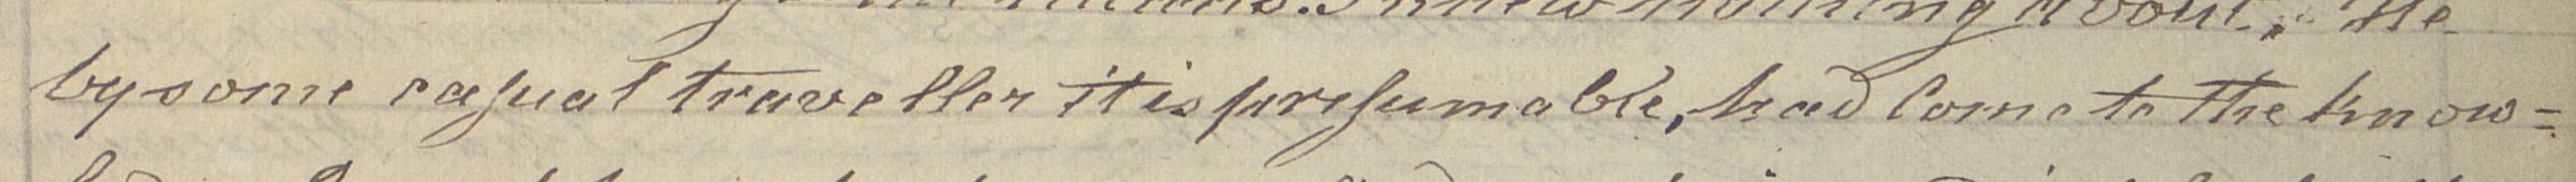by some repeat traveller it is presumable, had Come to the know-
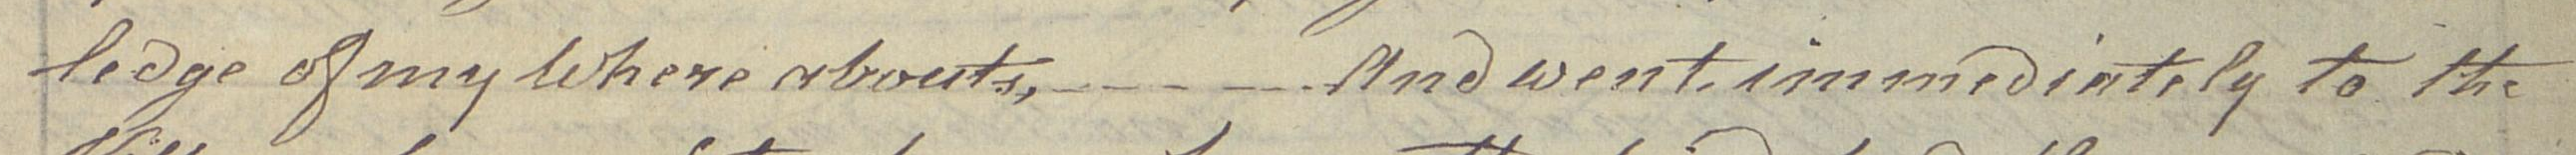lodge of my Where abouts, And went immediately to the
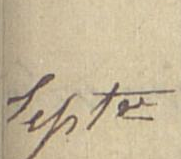Sept^r
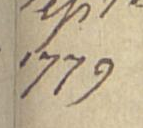1779
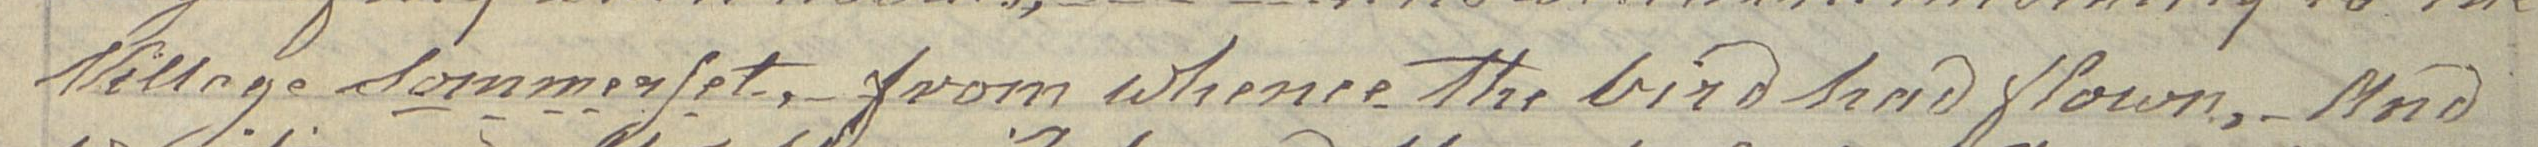Village Sommerset, from whence the bird had flown, And
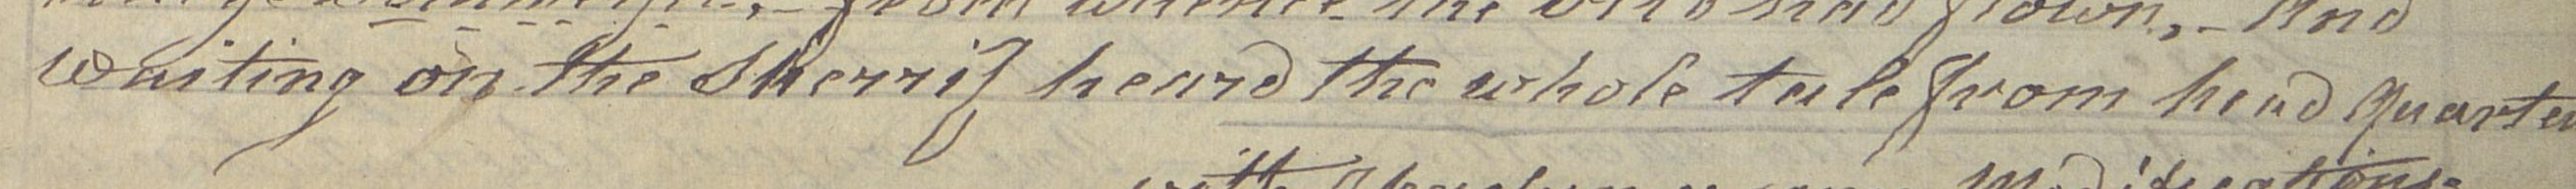waiting on the sherrif heard the whole tale from head quarter
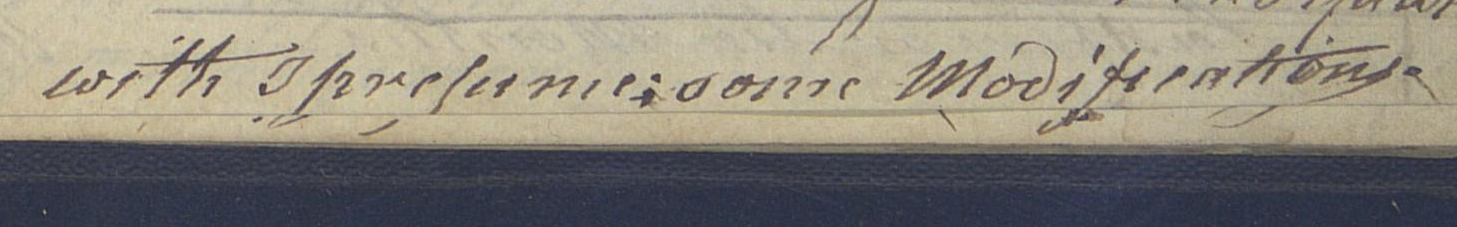with I presume: some Modifications.
